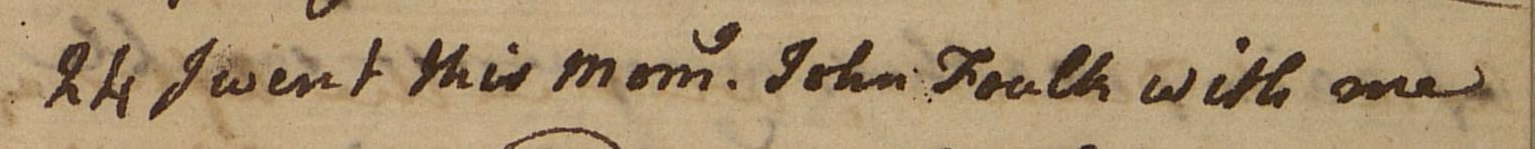24 I went this morn^g. John Foulk with me
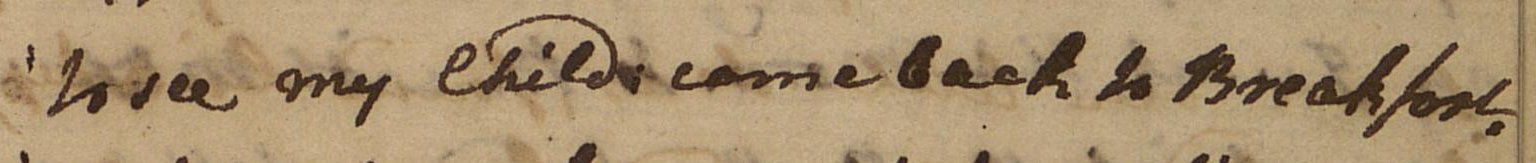to see my Child; came back to Breakfast,
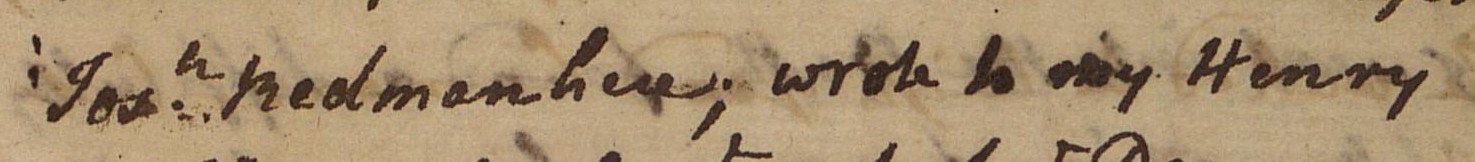Jos^h. Redman here; wrote to my Henry
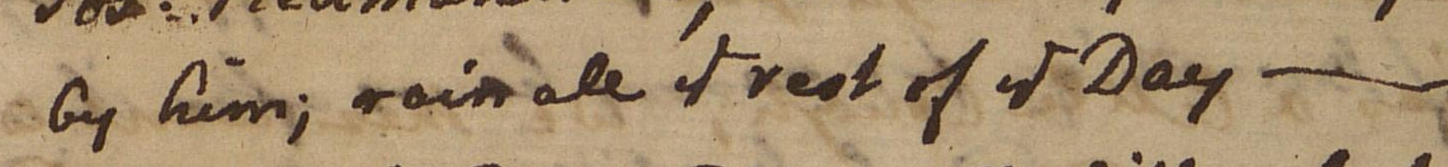by him, rain all y^e rest of y^e Day-
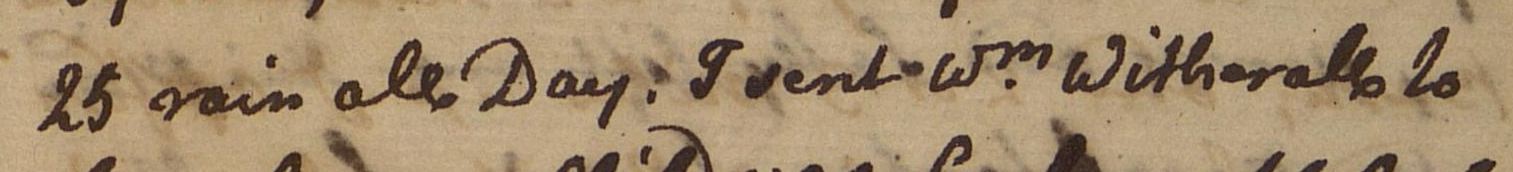25 rain all Day. I sent w^m. Witherall to
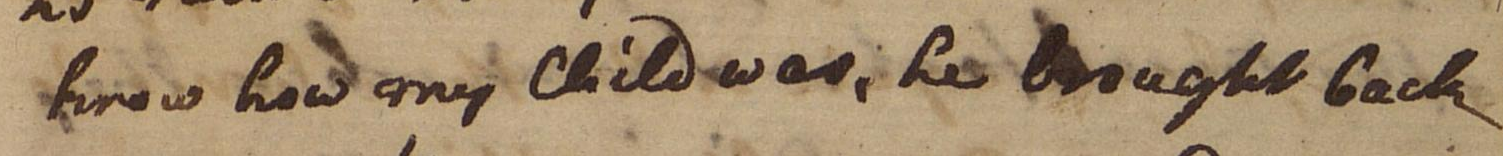know how my Child was, he brought back
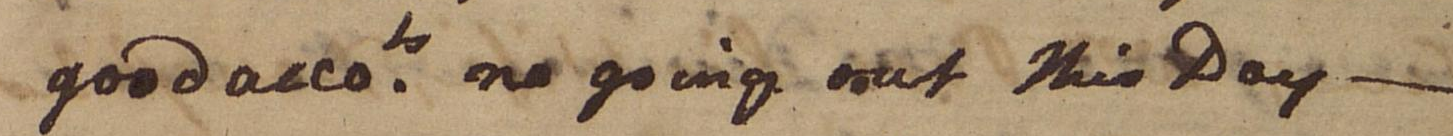good acco^ts. no going out this Day-
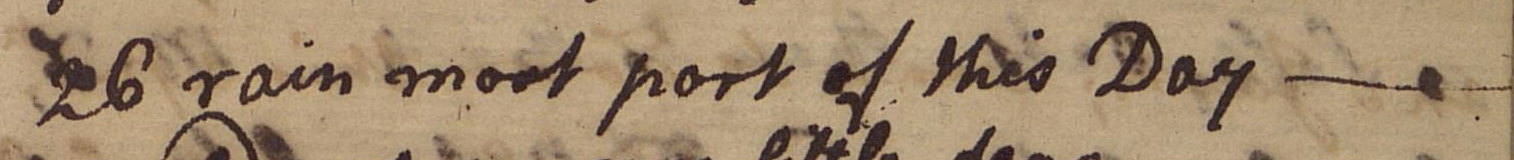26 rain most part of this Day-
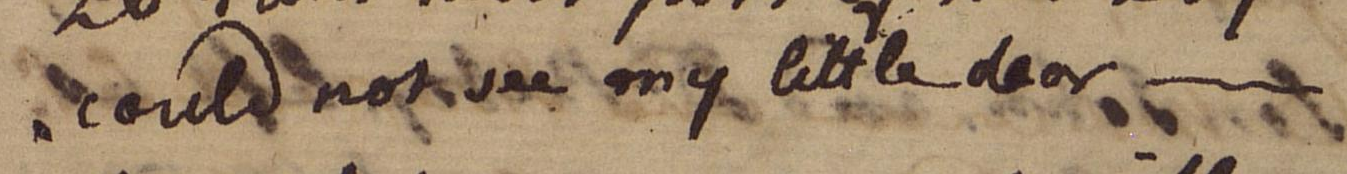could not see my little dear-
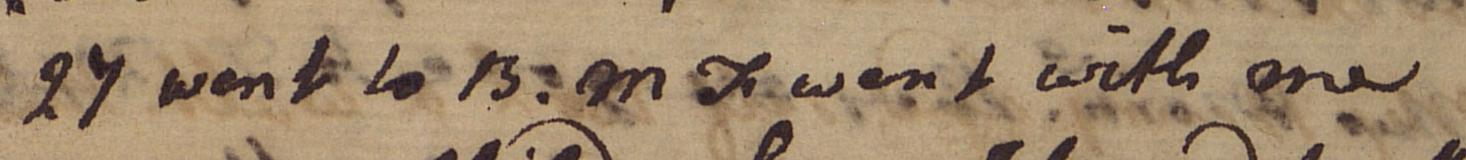27 went to B: MF went with me
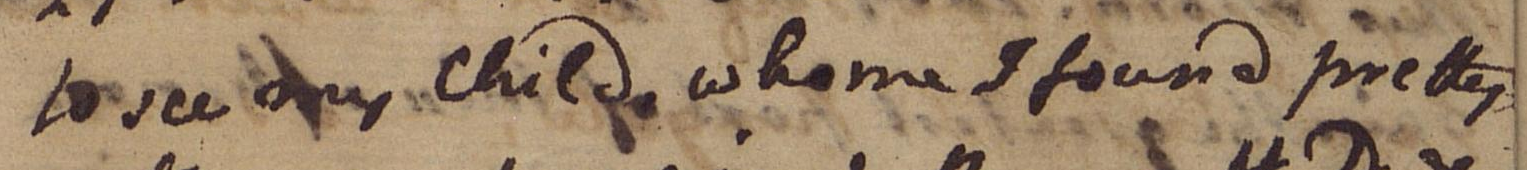to see my Child, whome I found pretty
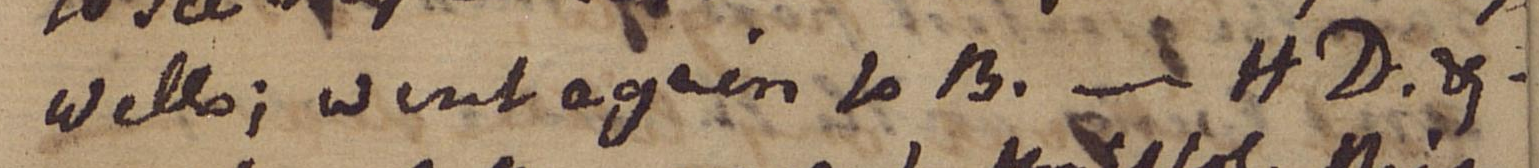well; went again to B.- HD. &
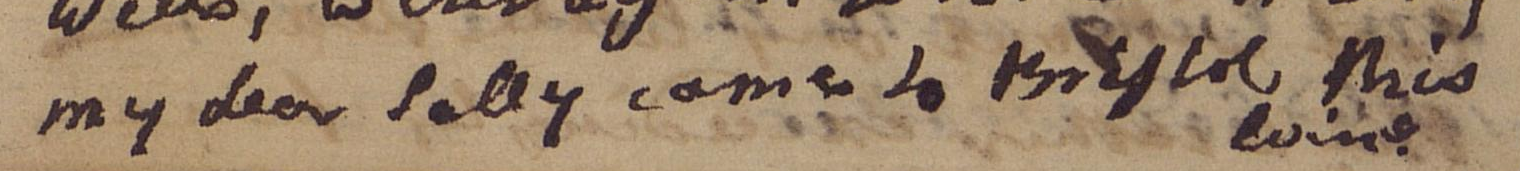my dear Sally came to Bristol this
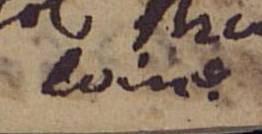Even^g.
